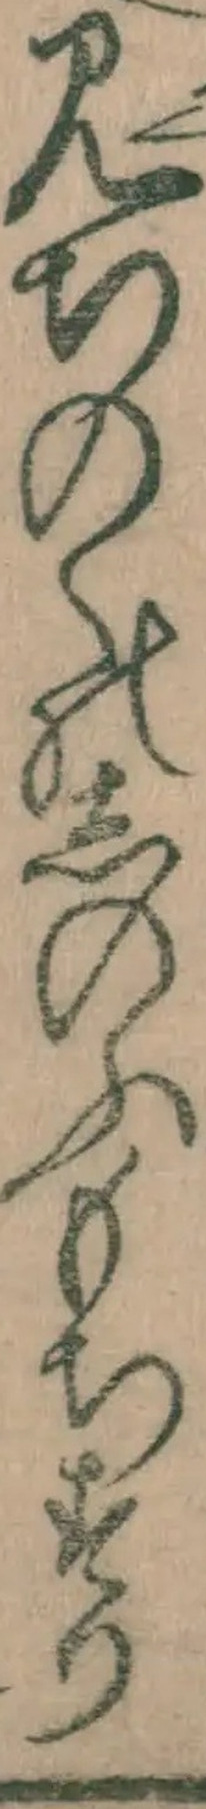みちのくのしのふもちすり
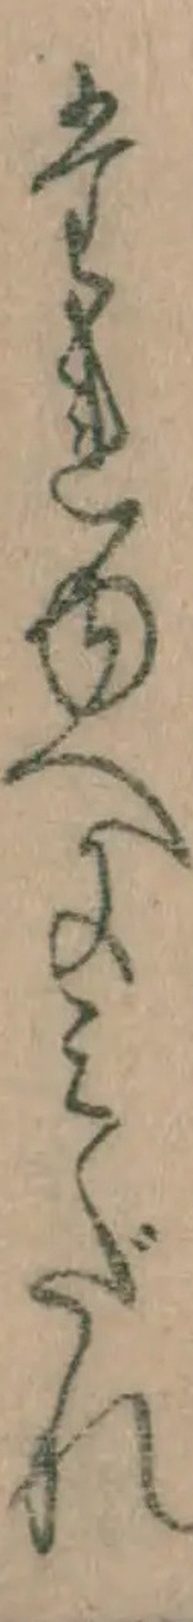たれゆへにみだれ
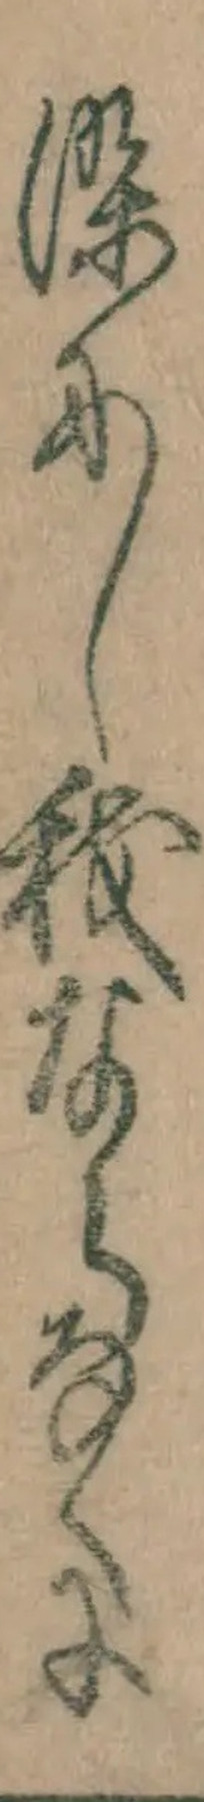染にし我ならなくに

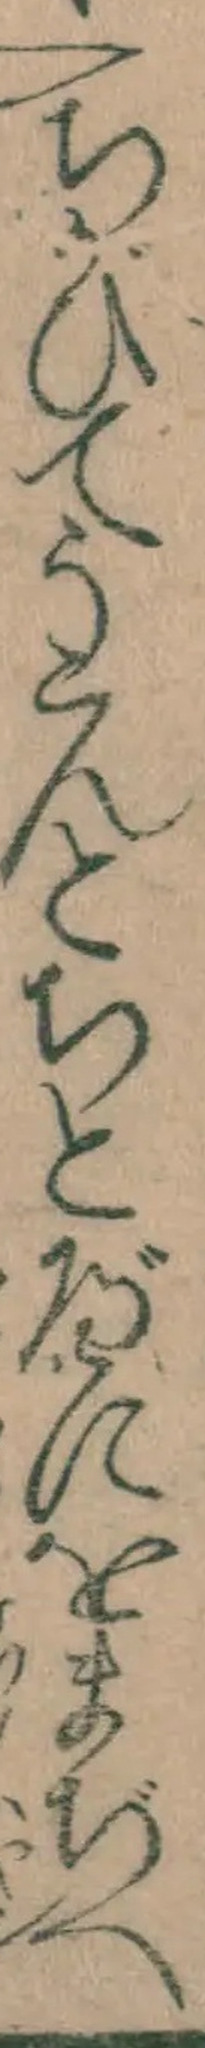つらきちがひてうこんとちとべにをまぢへ
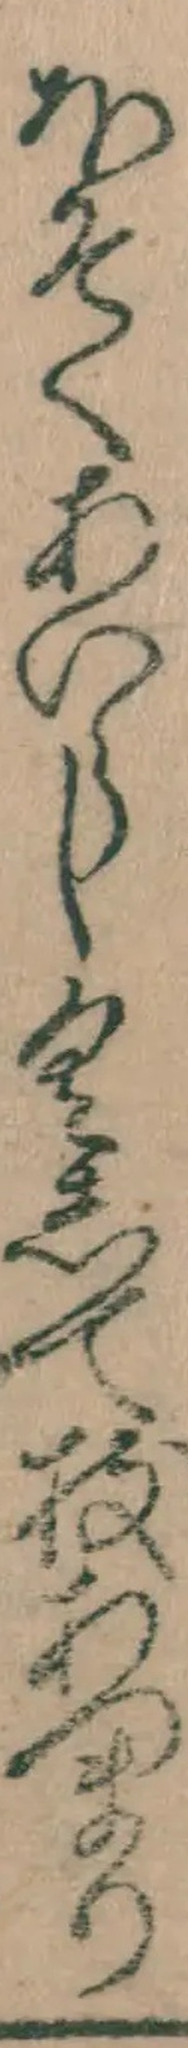ほそくあいらしくして枝あつまり
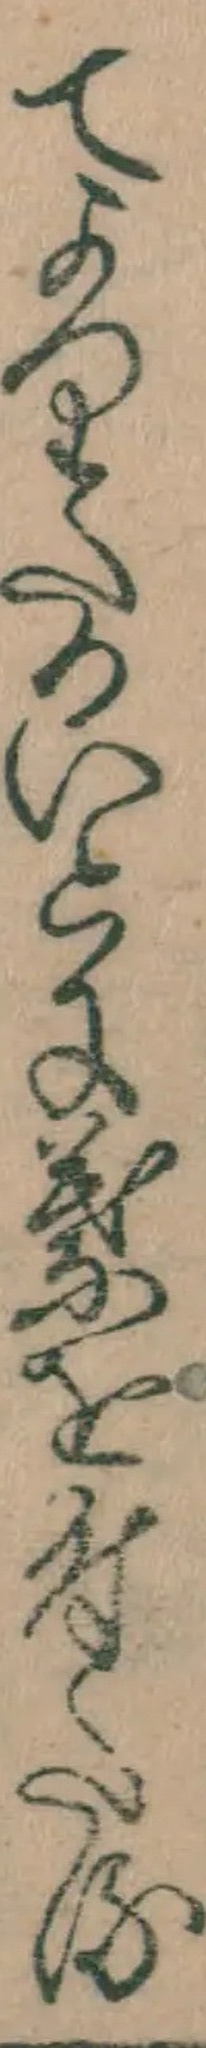てよりたるいとに葉を付たる
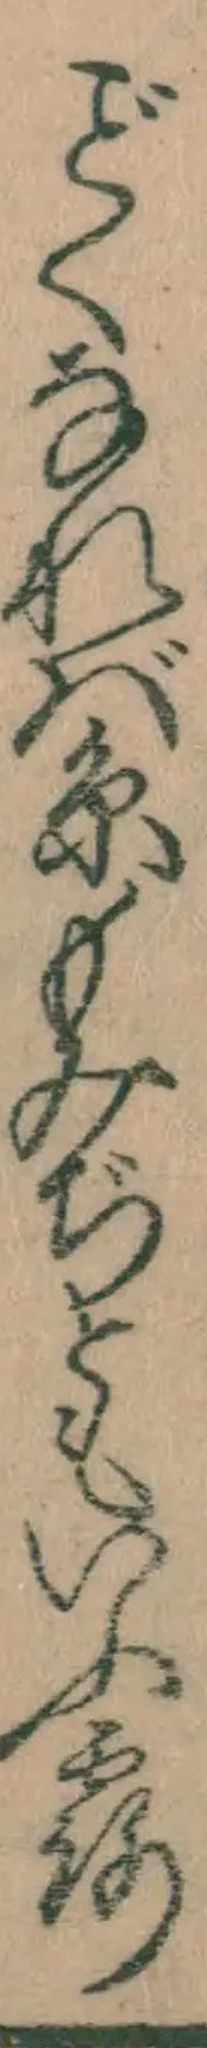ごとくなれば糸もみぢともいふ露
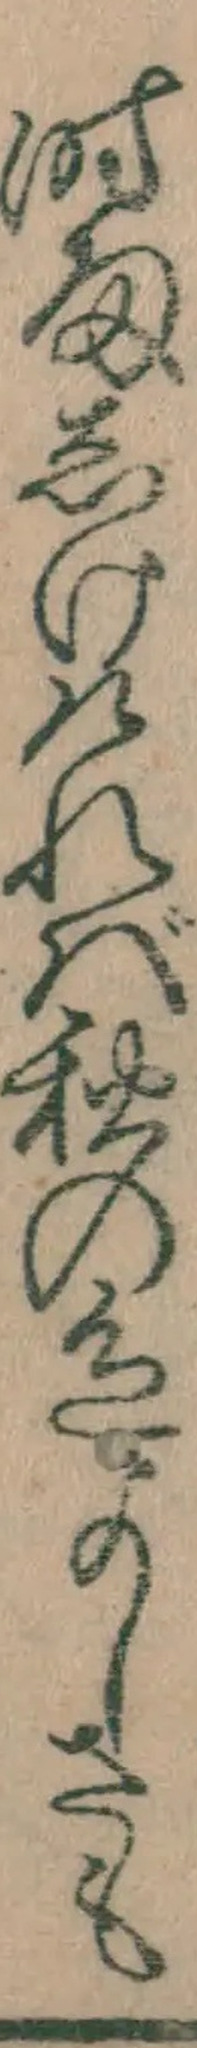時雨しけければ秋の色にしきも
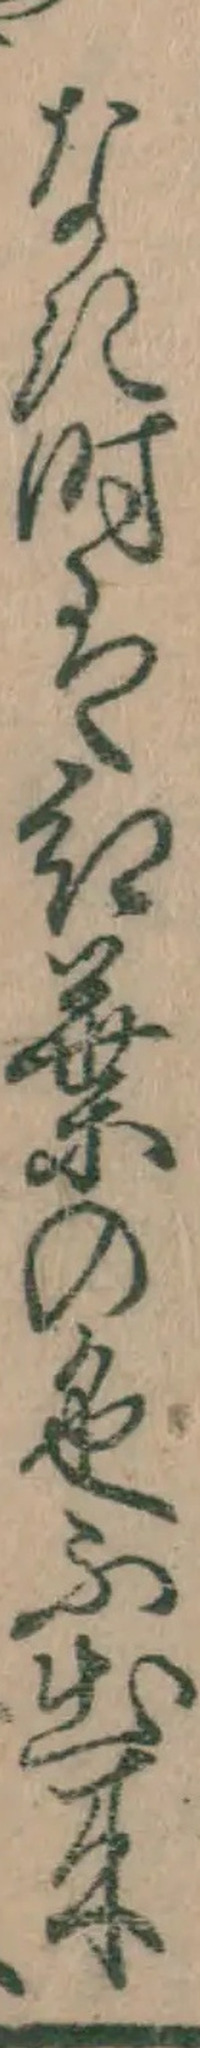なき時は紅葉の色不出来
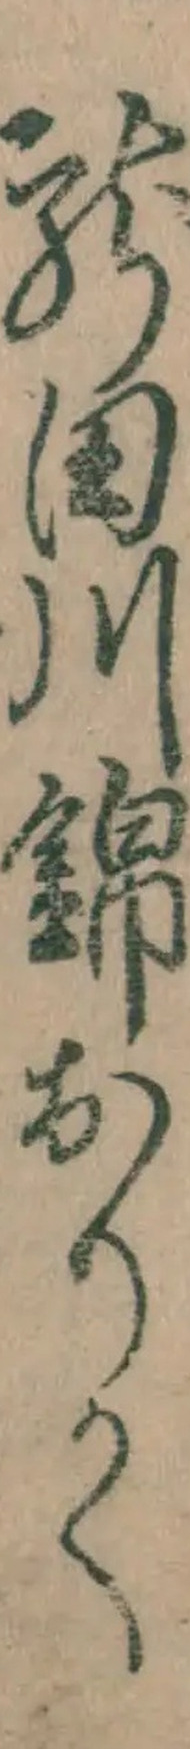龍田川錦おりかく
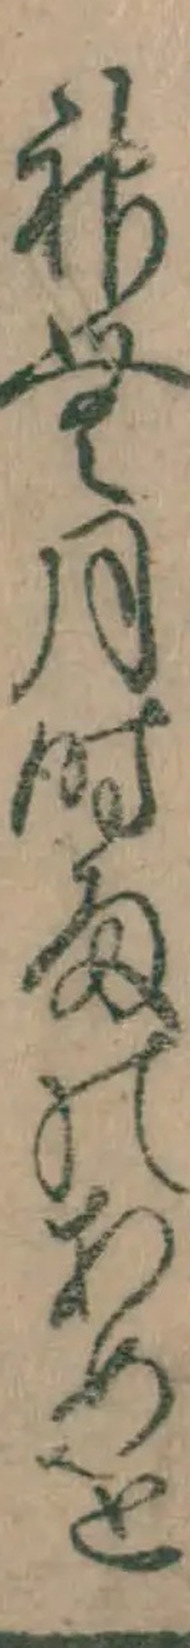神無月時雨のあめを
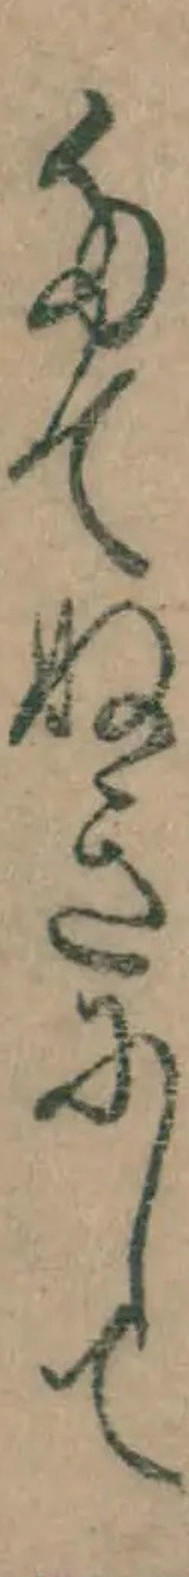たてぬきにして

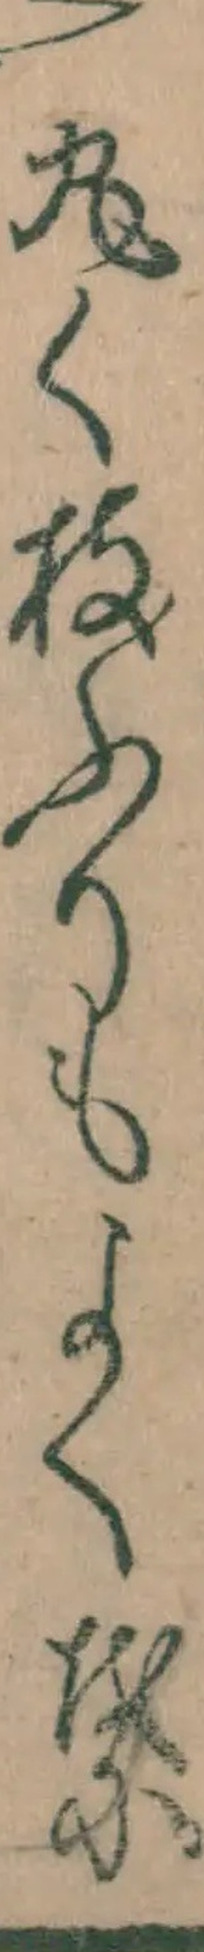丸く枝ふりもよく葉
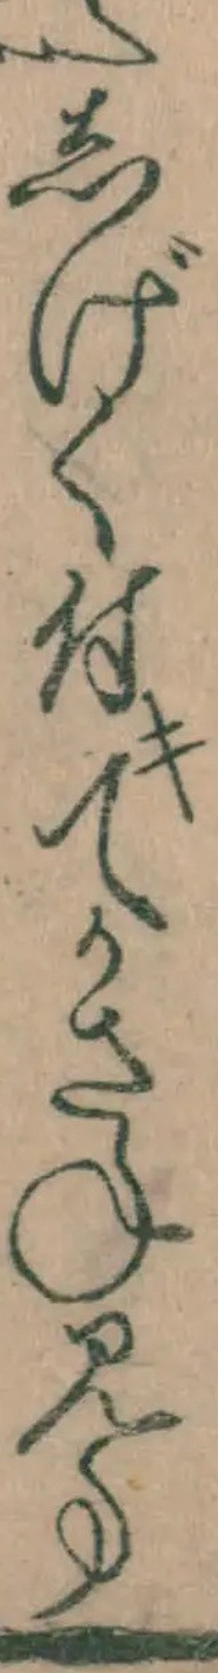しげく付見事
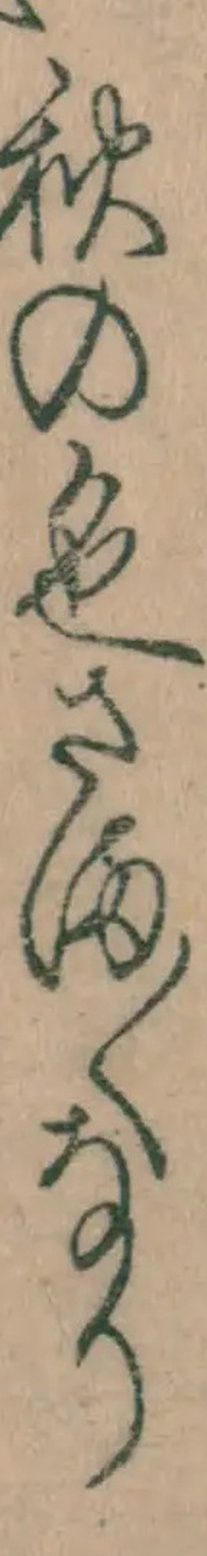秋の色さま〳〵なり
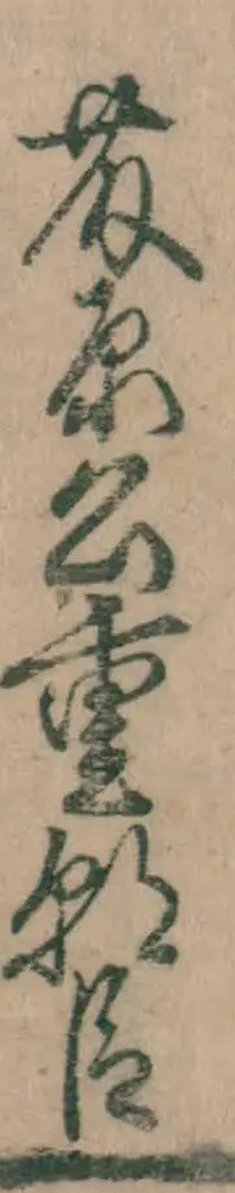藤原公重朝臣
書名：紅葉集
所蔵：国立国会図書館 National Diet Library, JAPAN
